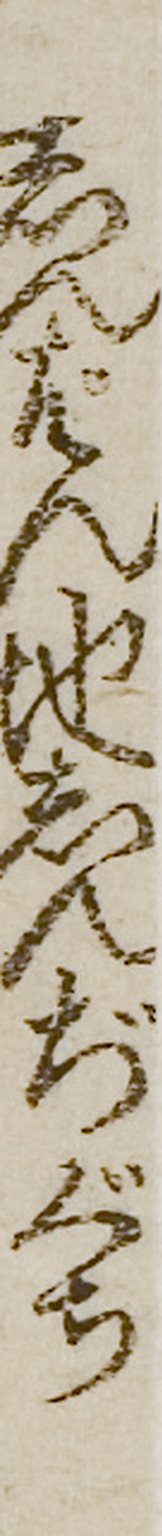しんばん地しんぢぐち
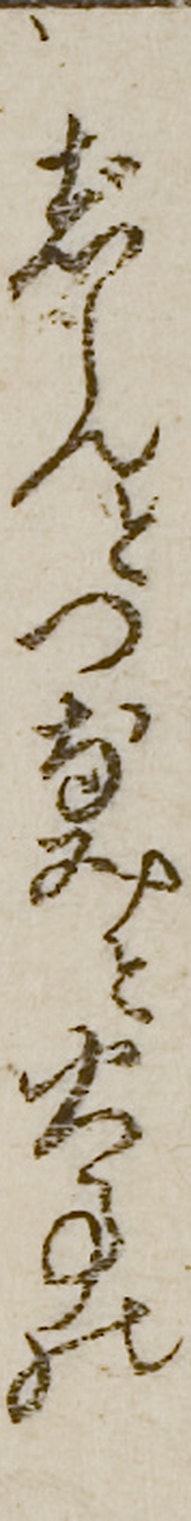じしんとつなみと火事の
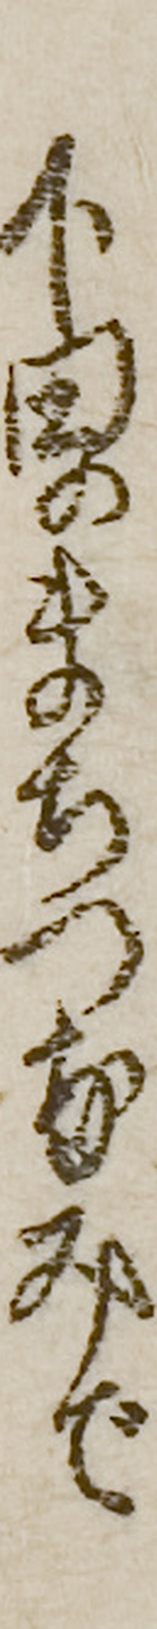下田のまちつなみで
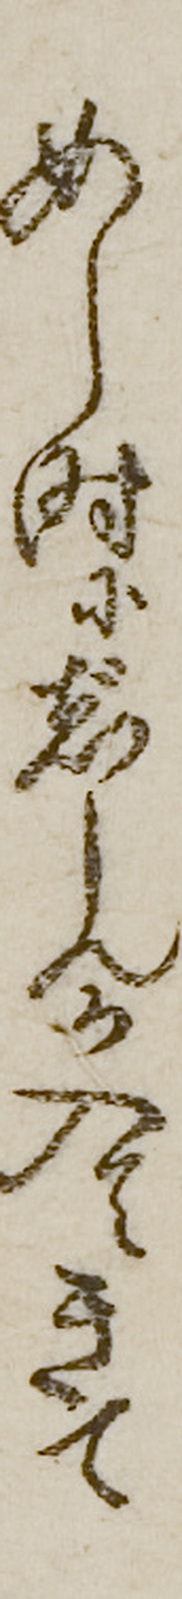めし時にじしんか入てきて
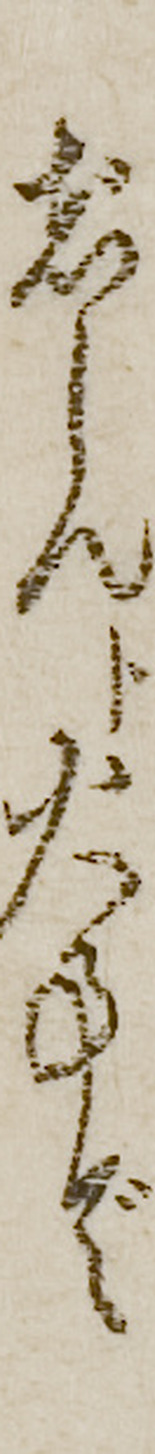じしんと火事で
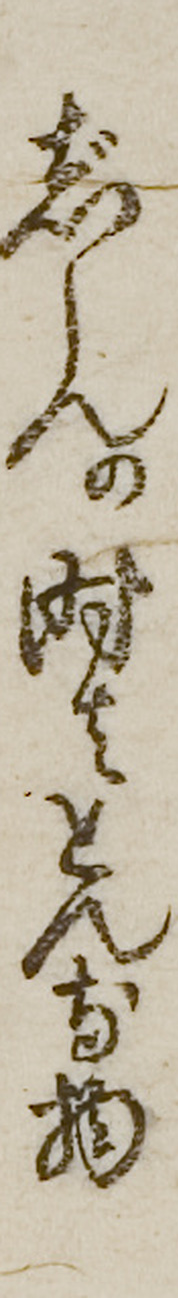じしんの時はとんな物
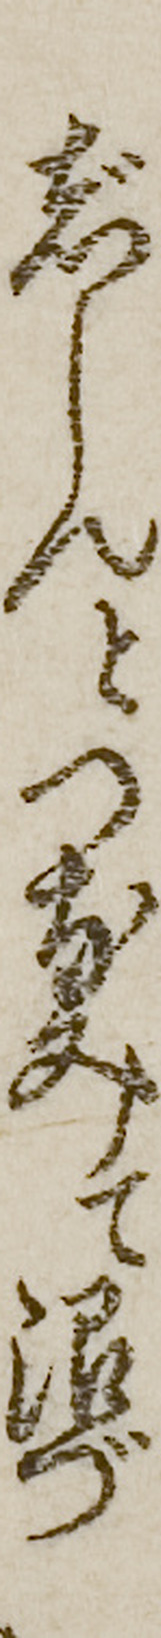じしんとつなみて沼づ
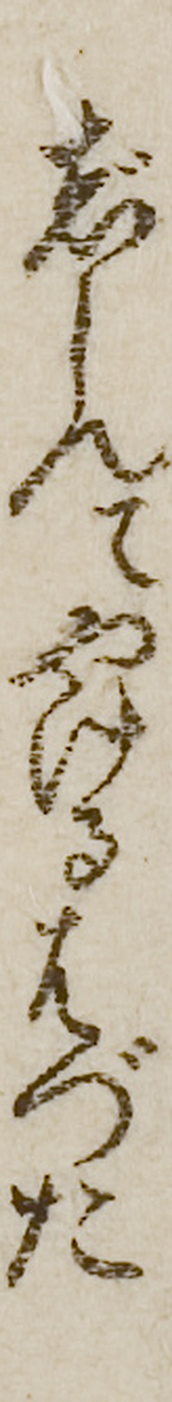じしんてやけるはづた
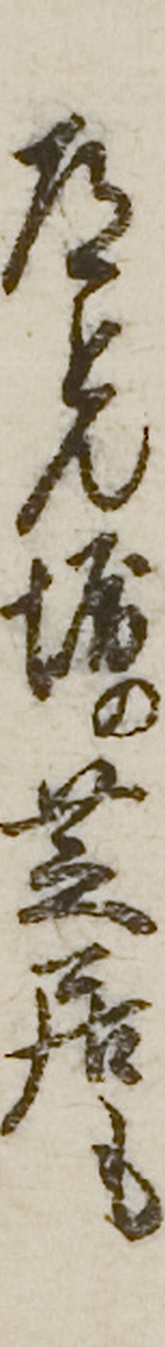道とん堀の芝居も
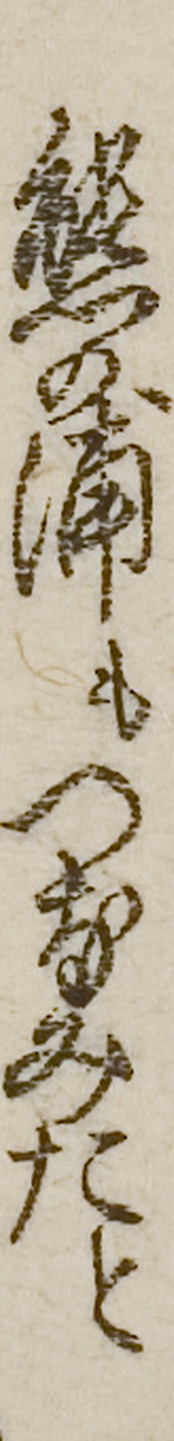熊の浦もつなみたと
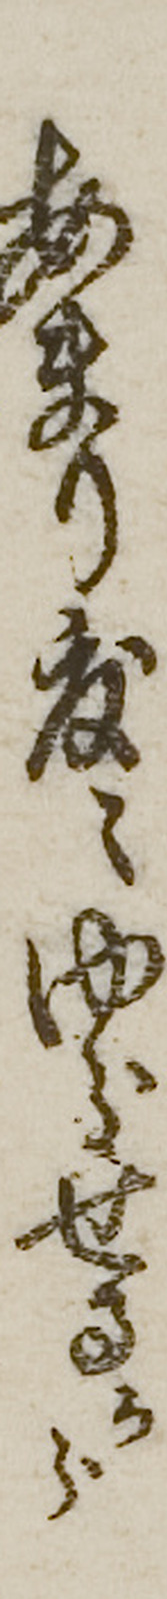あまり度々ゆらせるから
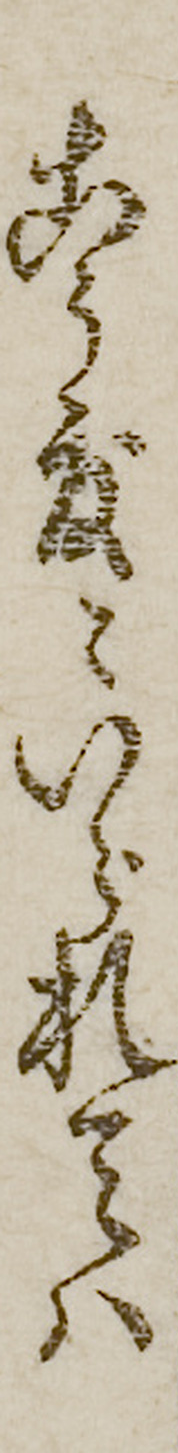こう度々いられては
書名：しんばん地しんぢぐち
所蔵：東京大学総合図書館 General Library in the University of Tokyo, JAPAN
